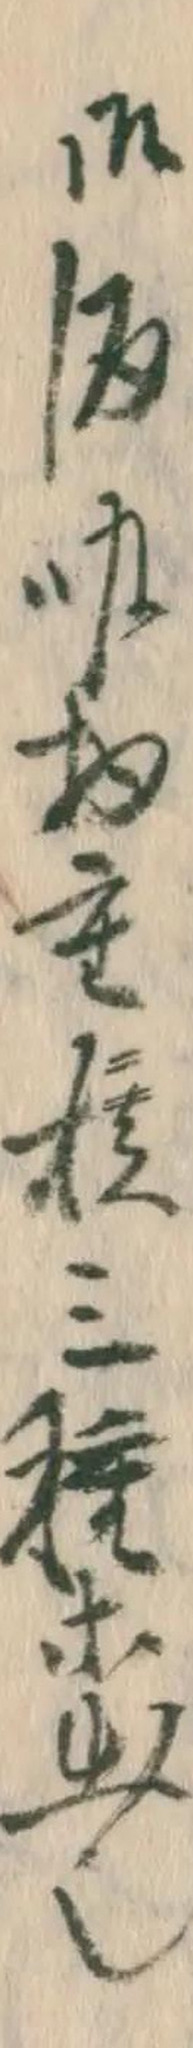御酒吸物重核三種等出也
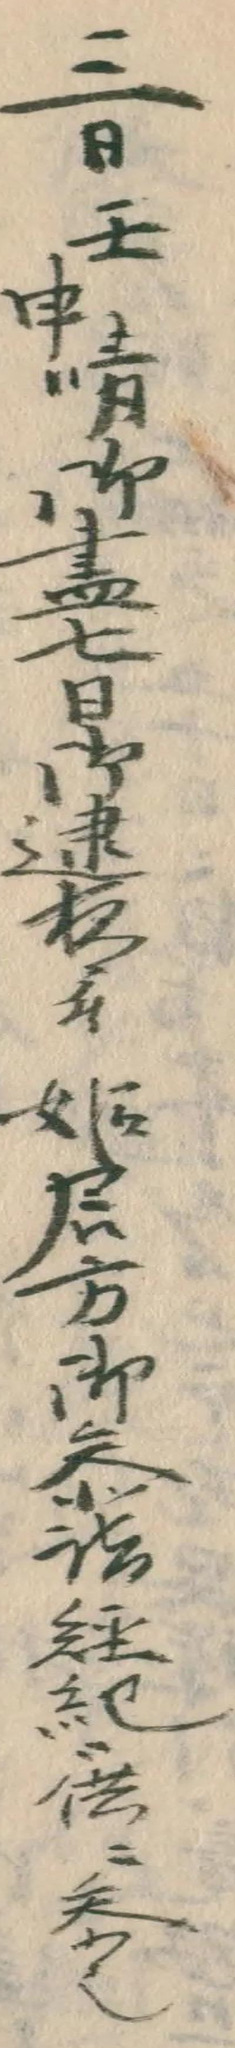三日壬申晴御盡七日御逮夜ニ付姫君方御参詣経紀御供ニ参也
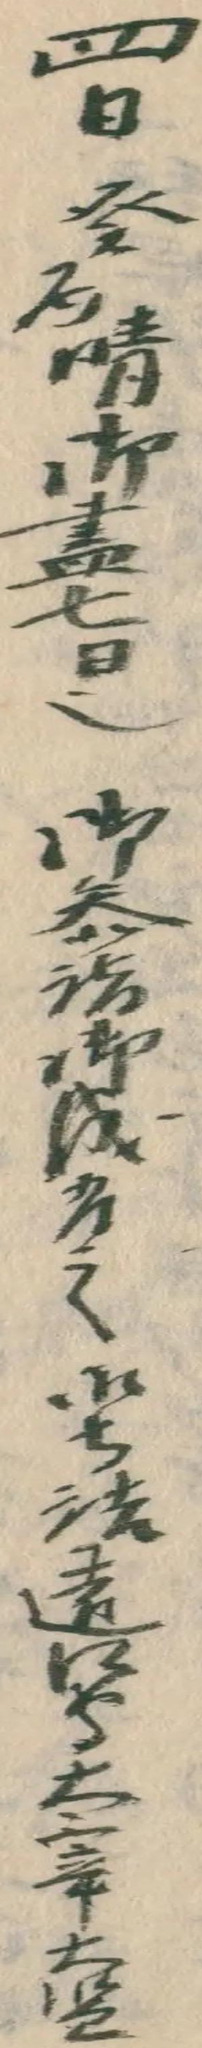四日癸酉晴御盡七日也御参詣御成有之御寺詰遠江守大宰大監
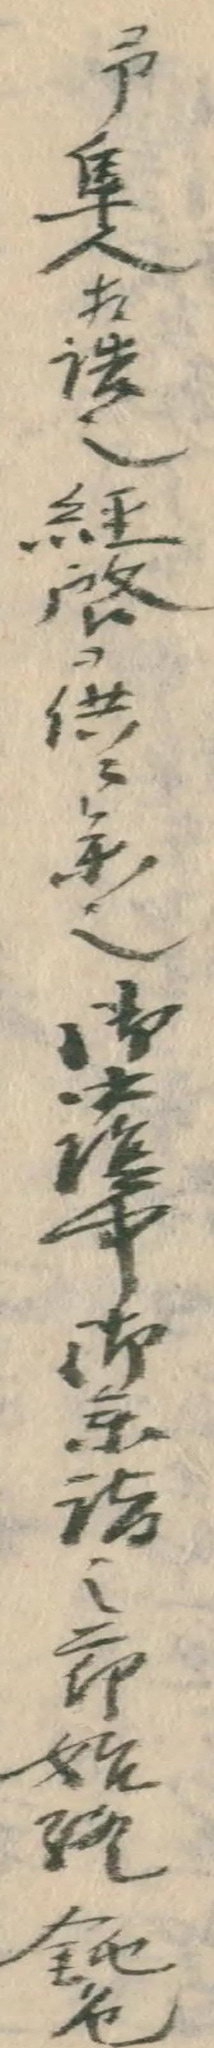予隼人相詰之経啓御供ニ参也御中陰中御参詣之節始終鈍色
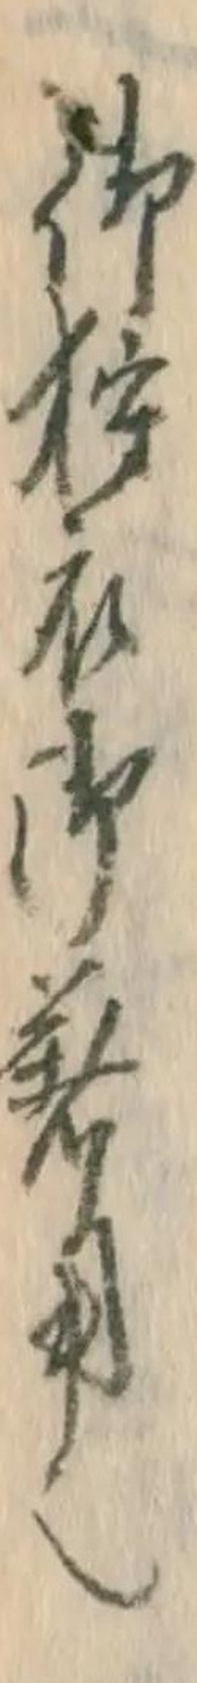御狩衣御着用也

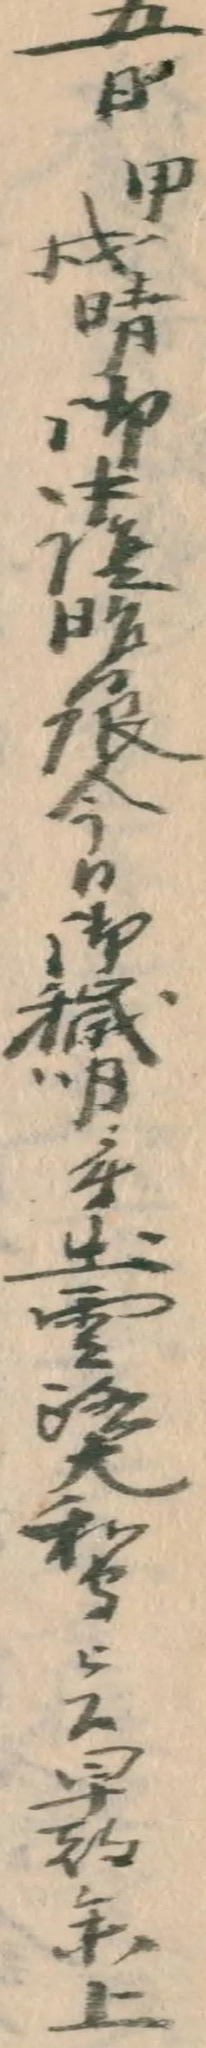五日甲戌晴御中陰昨日限今日御穢明ニ付出雲路大和守被召早朝参上
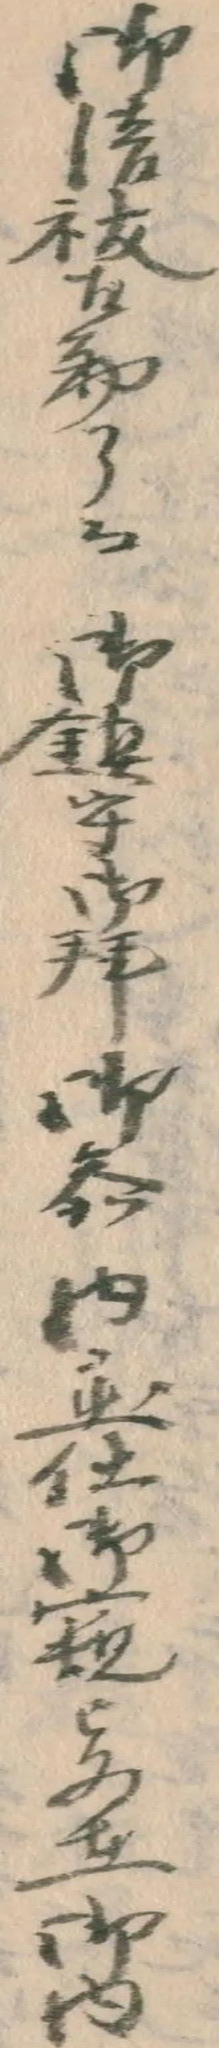御清祓相勤了而御鎮守御拝御参内御出仕御窺被為在御内
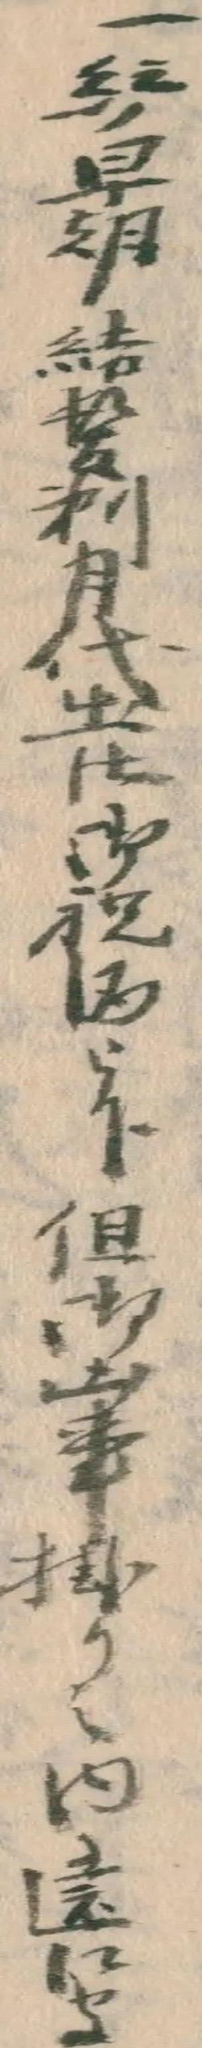一統早朝結髪剃月代出仕御祝酒被下但御凶事掛り之内遠江守
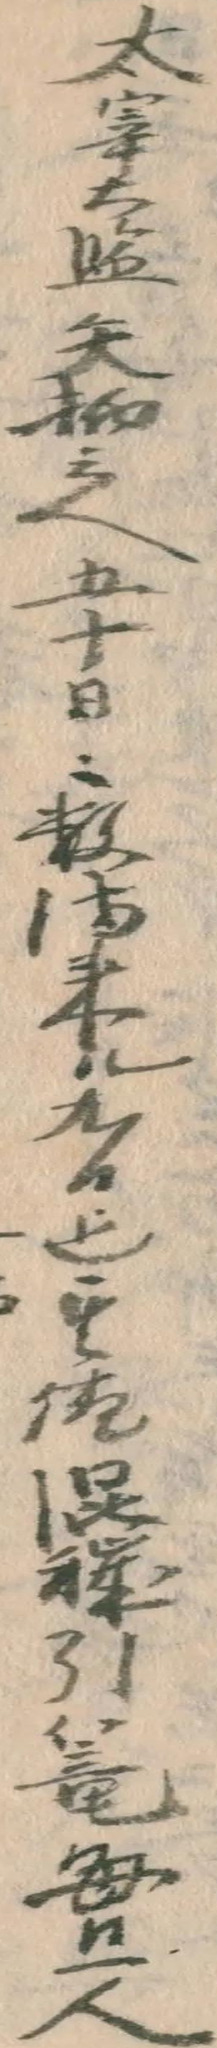太宰太監矢柄三人五十日ニ数満来ル九日迄其侭混穢引篭毎日一人
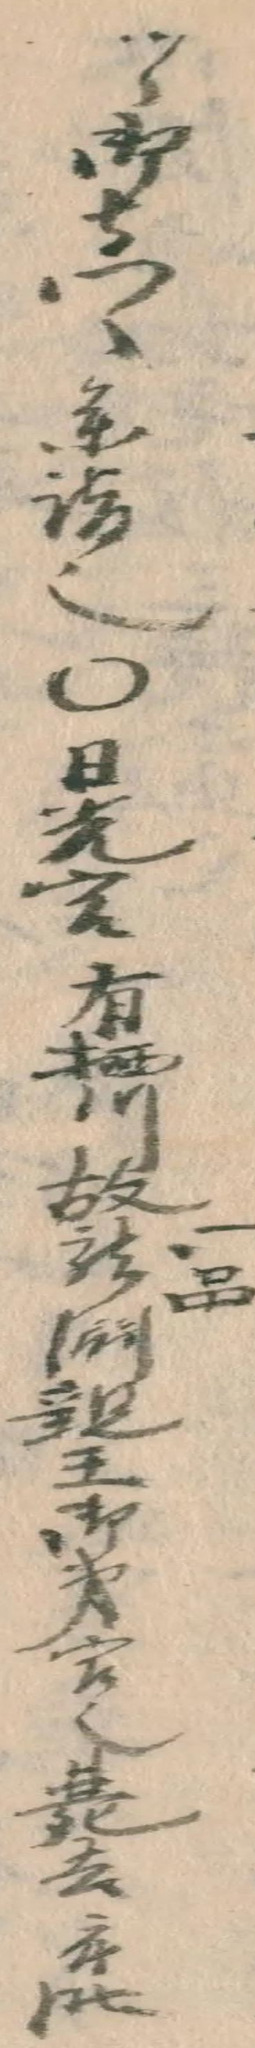ツヽ御寺門へ参詣也○日光宮有栖川故一品親王御弟宮之薨去ニ付昨
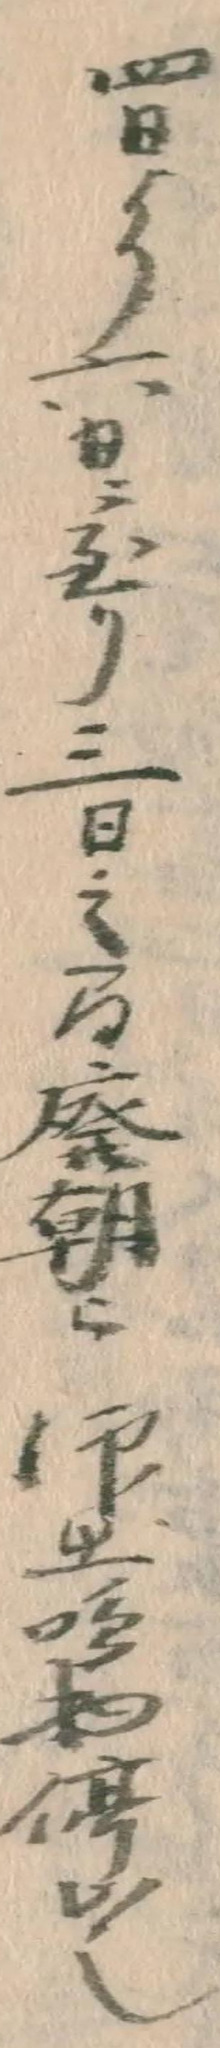四日より六日に至り三日之間廃朝被仰出鳴物停止也
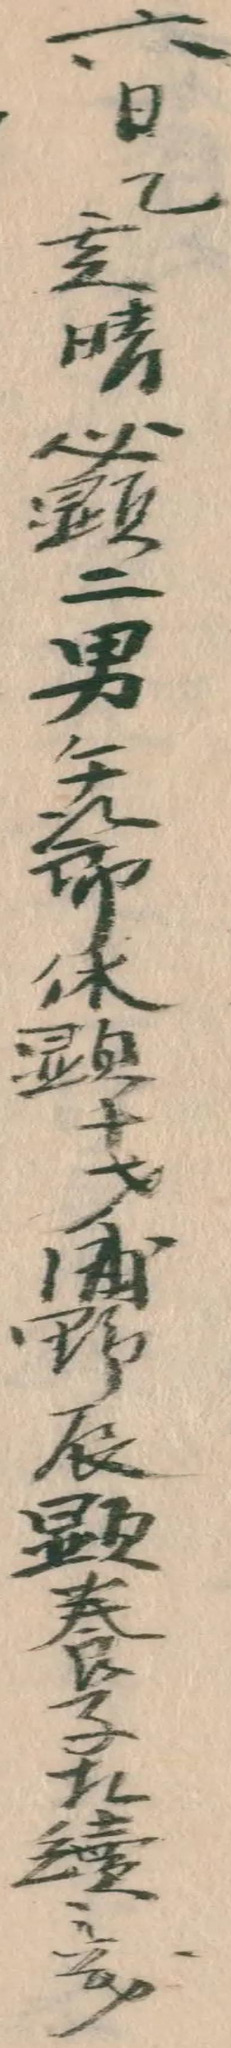六日乙亥晴必顕二男午次郎休顕十才浦野辰顕養子相續之義
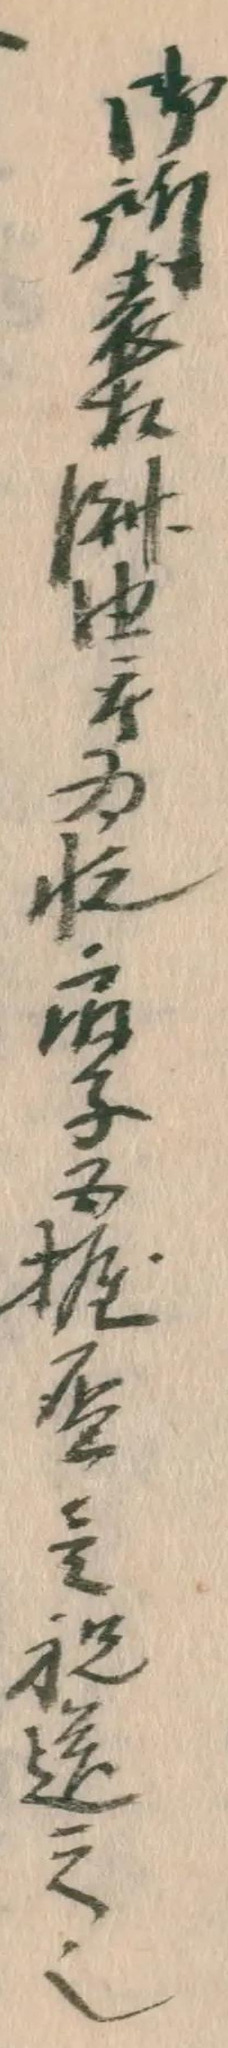御所表相済由ニ付為祝扇子五握盃壱祝送之也
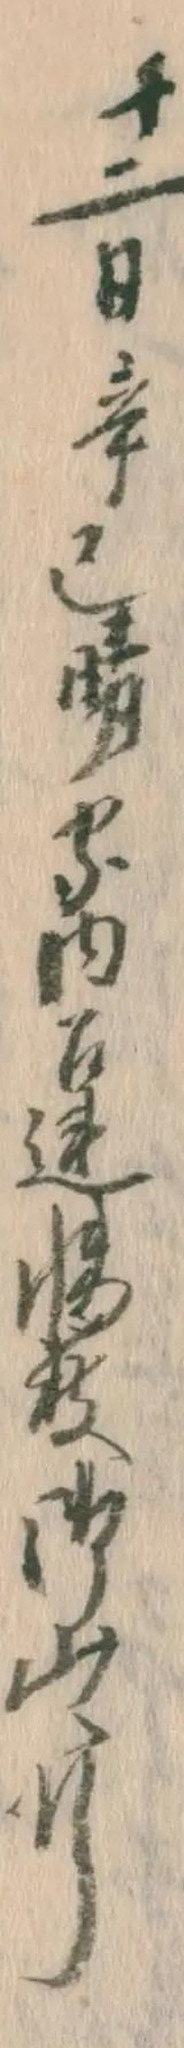十二日辛巳晴家内召連幡枝御山へ行
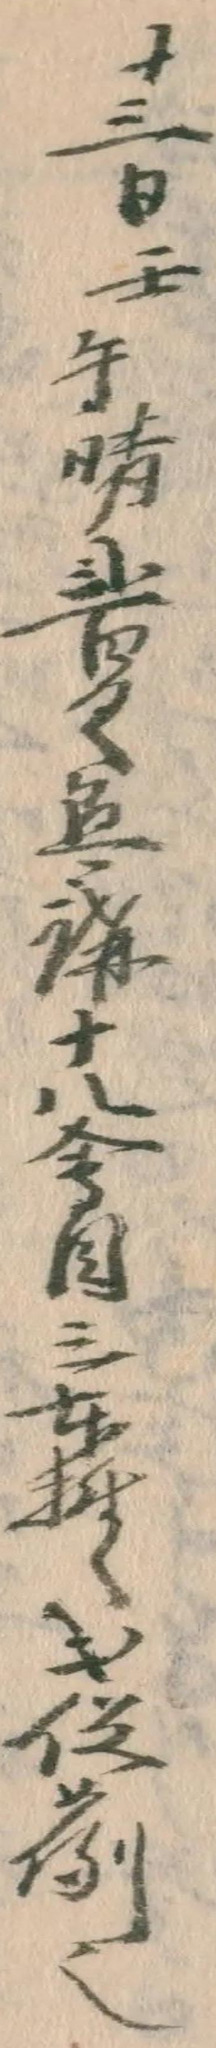十三日壬午晴弐百匁懸御講十八會目三本樹ヘ出役如例也
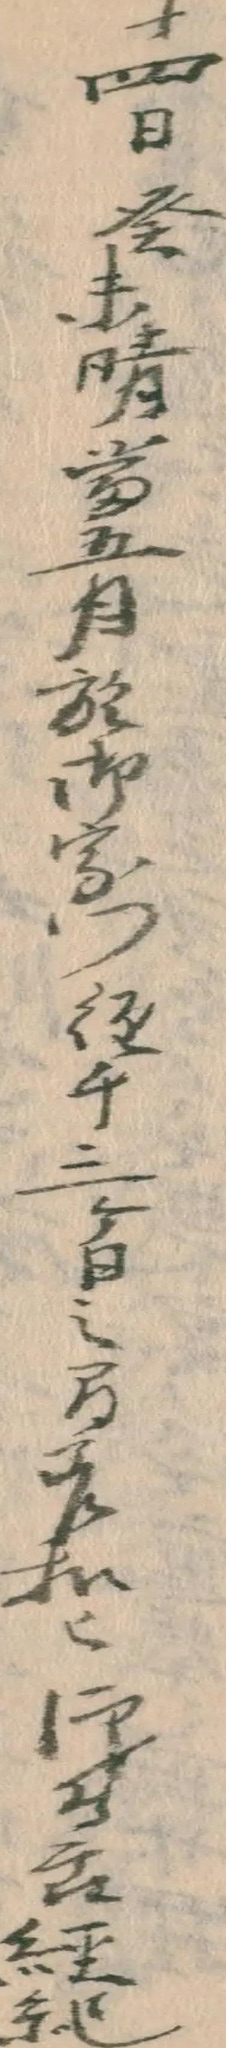十四日癸未晴當五月於御家門経千三ケ日之間差押被仰付節経紀
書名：賀茂社記録. 第69冊
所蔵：国立国会図書館 National Diet Library, JAPAN
